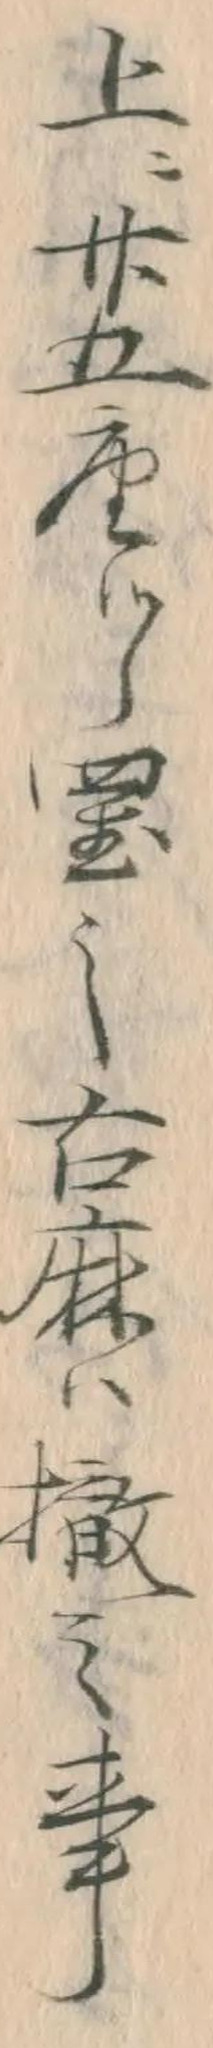上ニ廿五座ツヽ置之右麻ハ撒之事
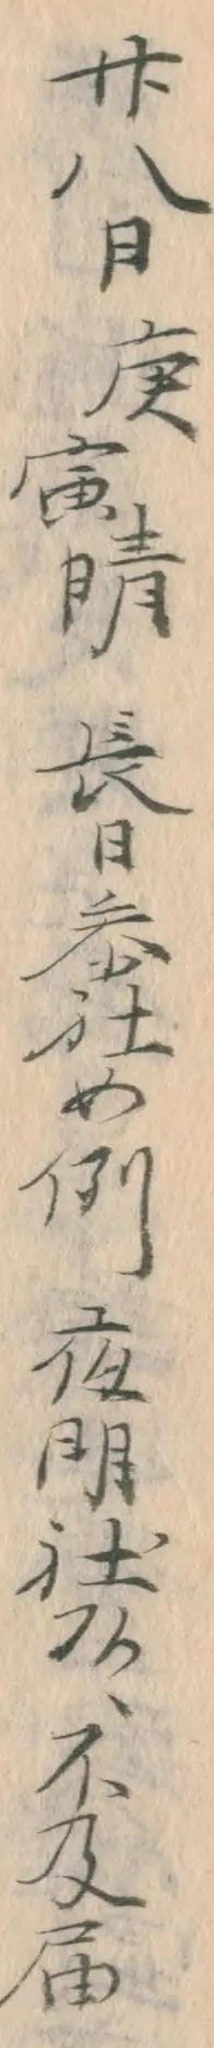廿八日庚寅晴長日参社如例夜明社頭ヘ不及届
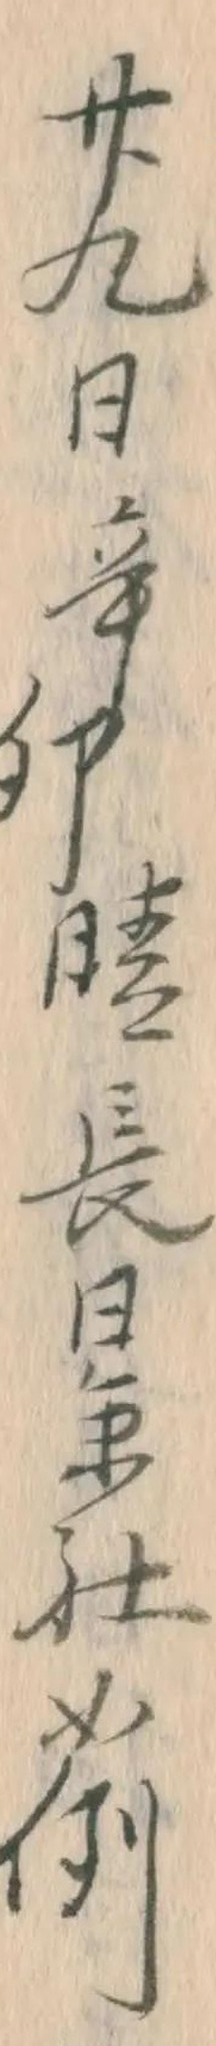廿九日辛申晴長日参社如例
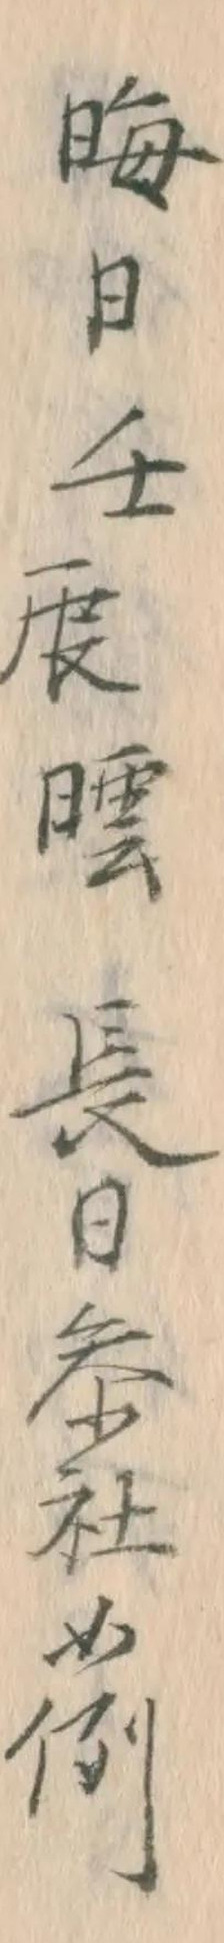晦日壬辰曇長日参社如例
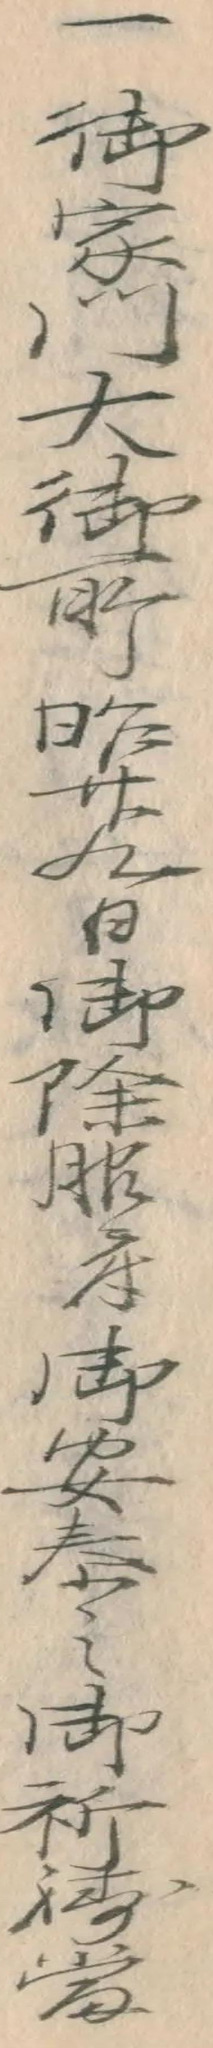一御家門大御所昨廿九日御除服ニ付御安泰之御祈祷當
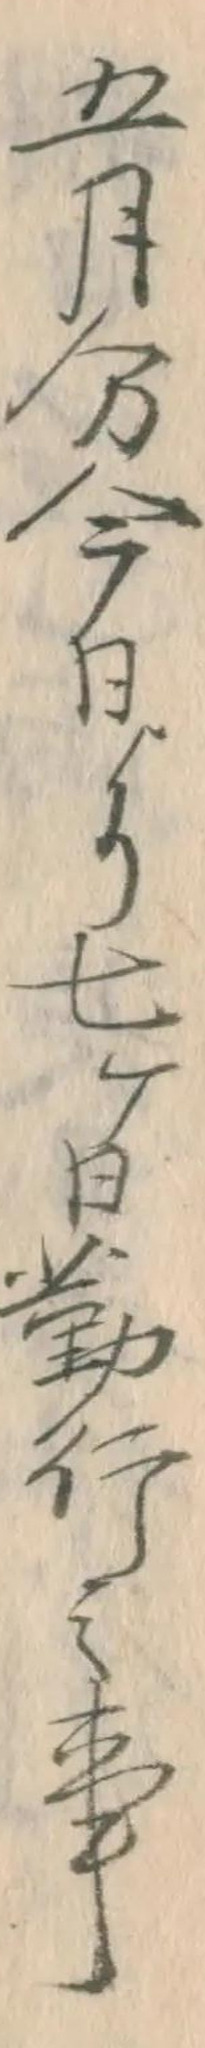五月分今日より七ケ日勤行之事

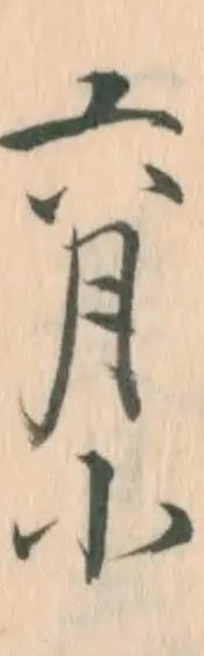六月小
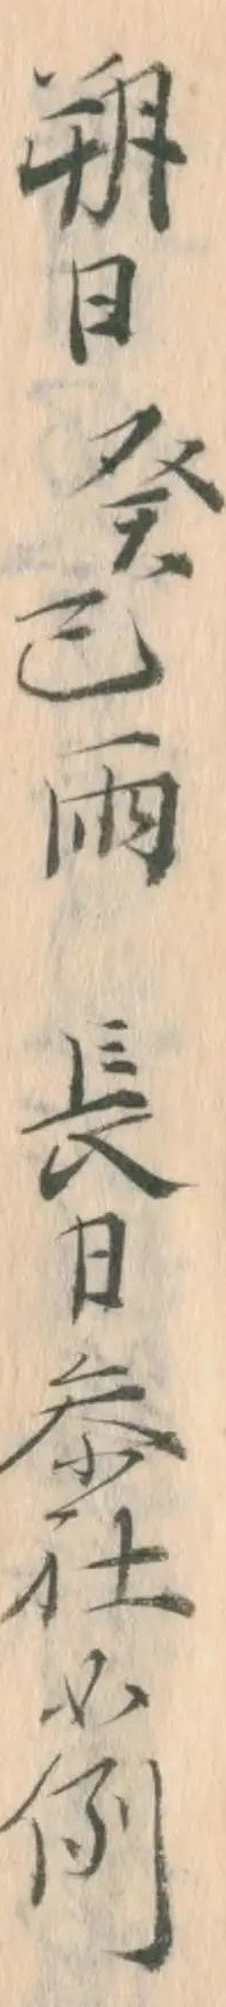朔日癸巳雨長日参社如例
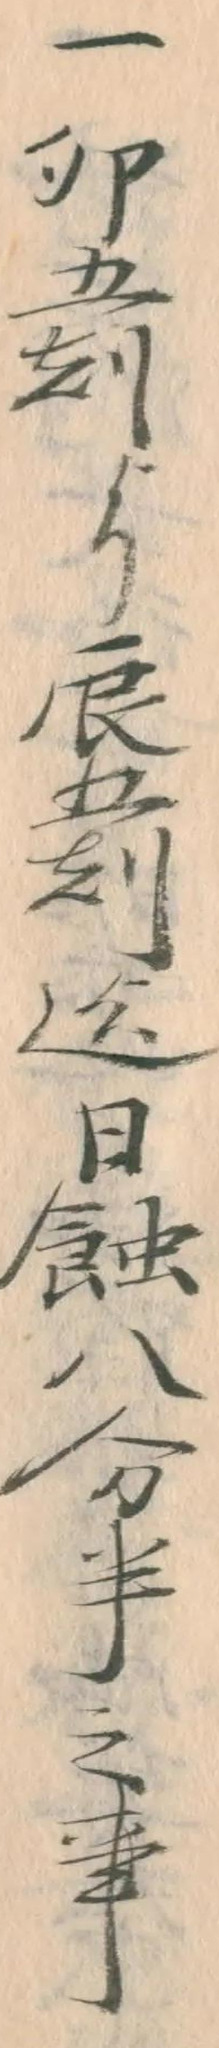一卯五刻より辰五刻迄日蝕八分半之事
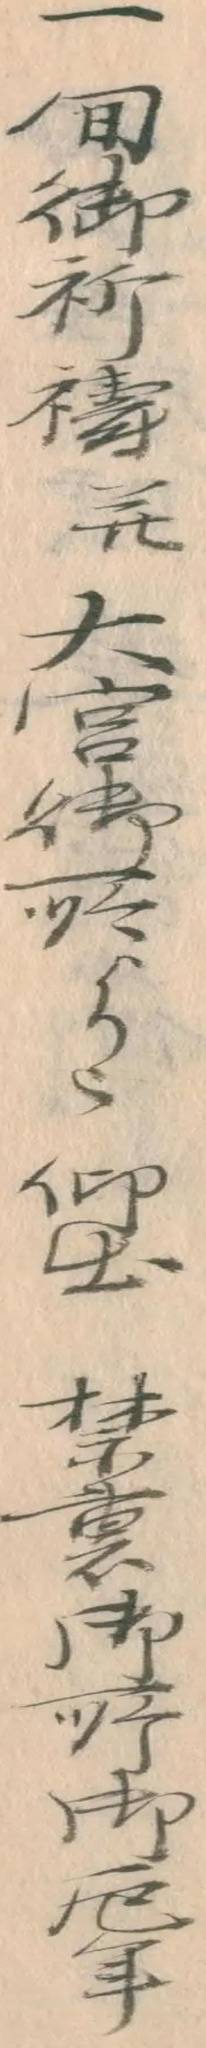一旬御祈祷并大宮御所より被仰出禁裏御所御厄年
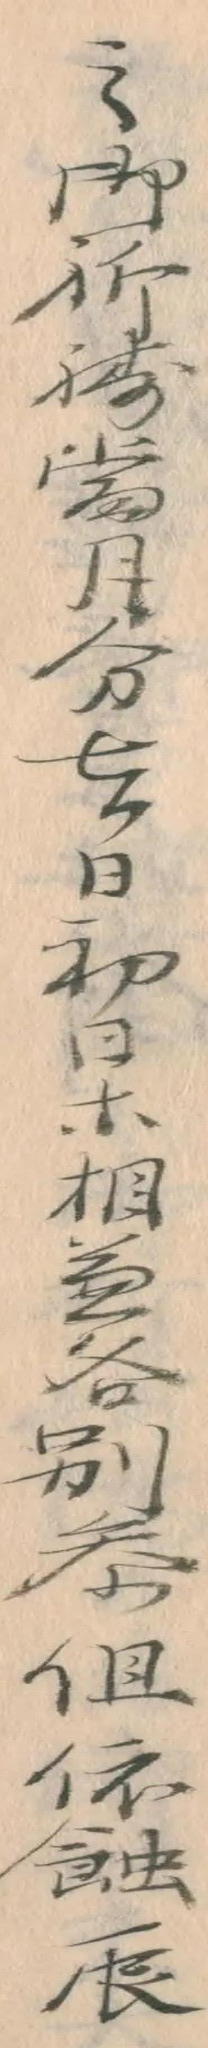之御祈祷當月分七日初日等相兼各別参但依蝕辰
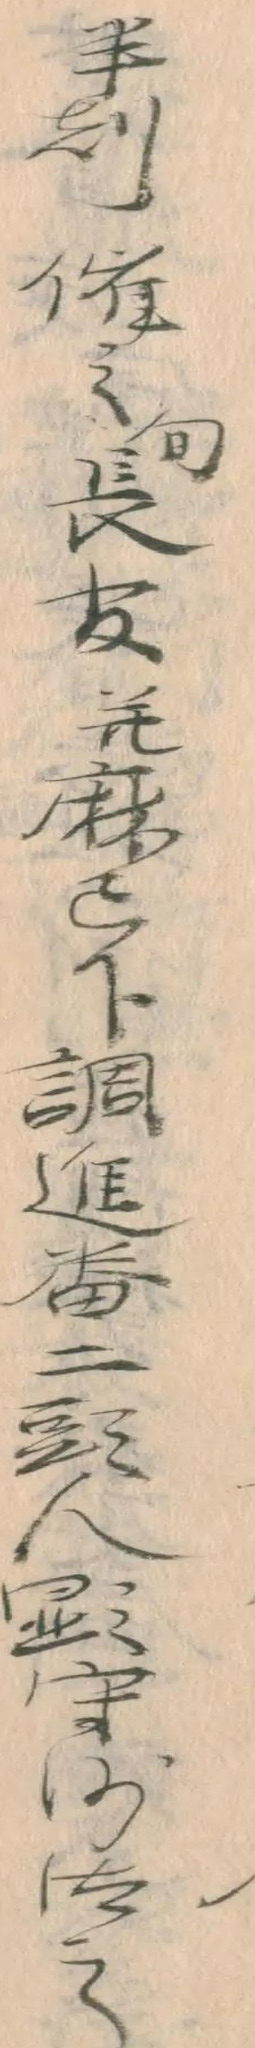半刻催之旬長官并麻已下調進番二頭人顕守沙汰之
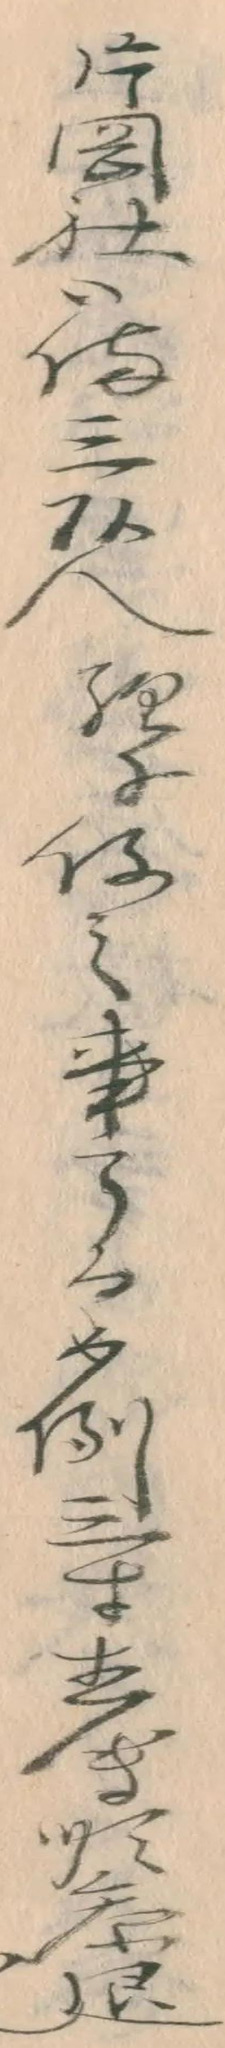片岡社御備三頭人経子役之事了而如例三寸直會順参退出也
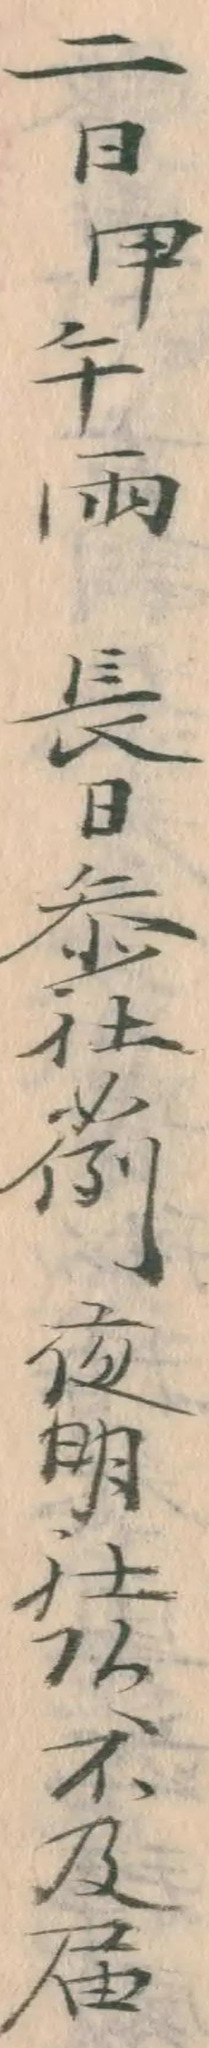二日甲午雨長日参社如例夜明社頭へ不及届
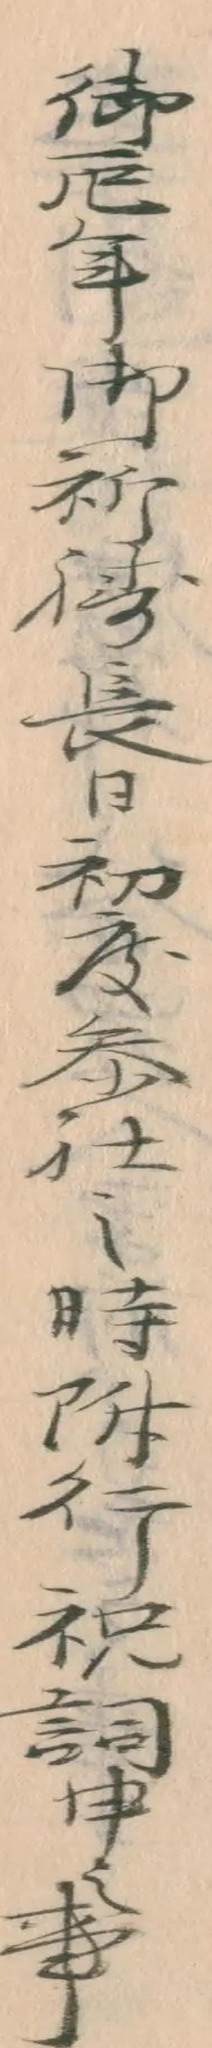一御厄年御祈祷長日初度参社之時附行祝詞申之事
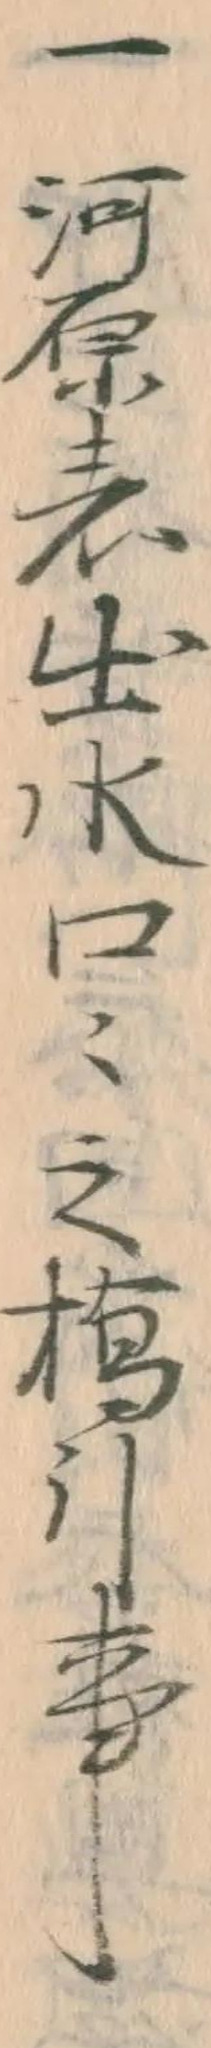一河原表出水口々之橋引事
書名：賀茂社記録. 第73冊
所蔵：国立国会図書館 National Diet Library, JAPAN
